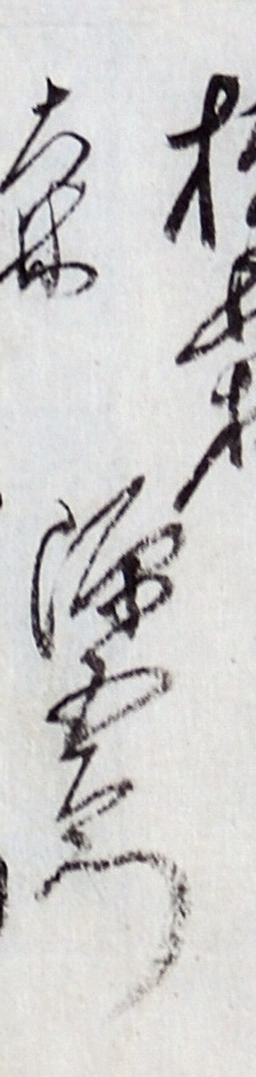山守源五右衛門
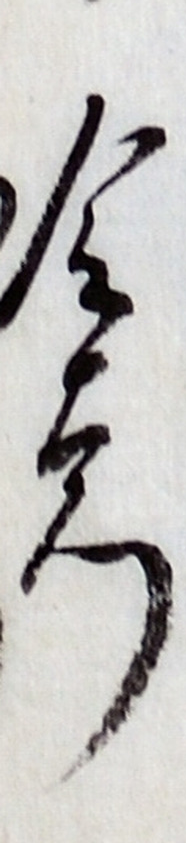茂右衛門
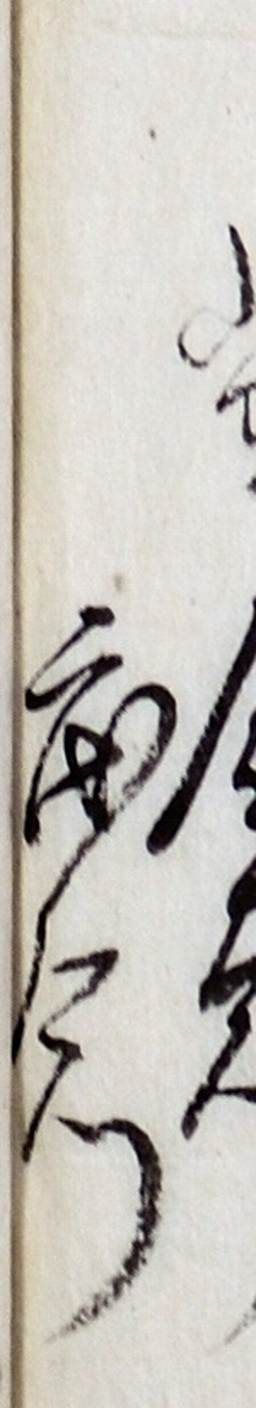茂右衛門
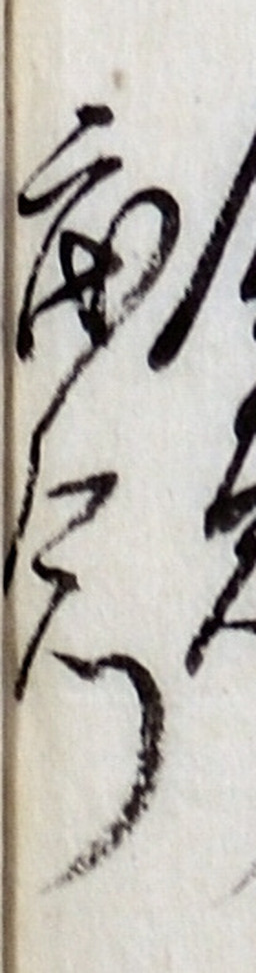茂右衛門
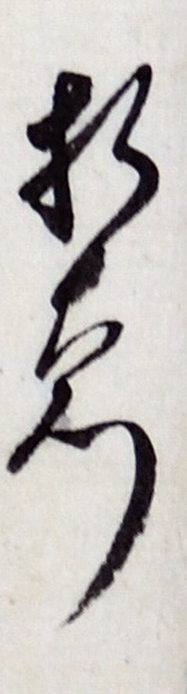茂右衛門
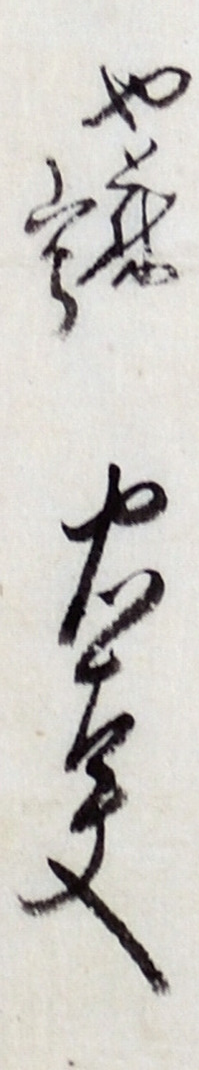山守忠太夫
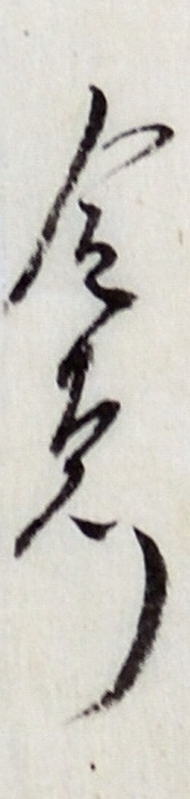金右衛門
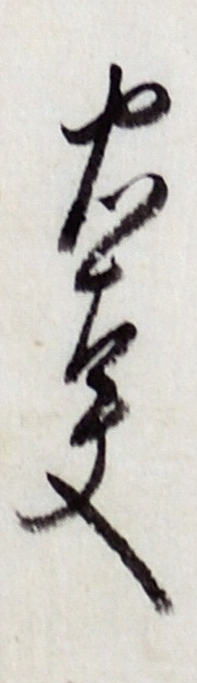忠太夫
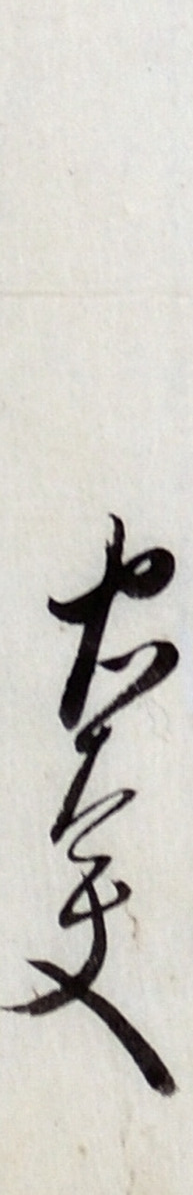忠太夫
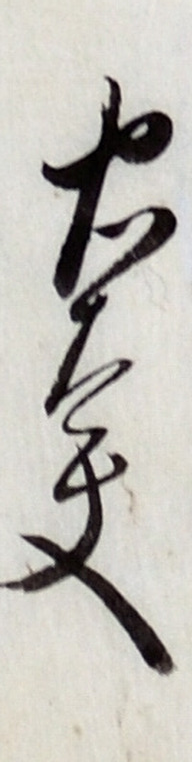忠太夫
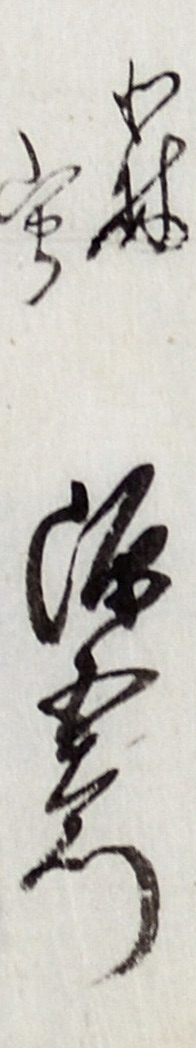山守源五右衛門
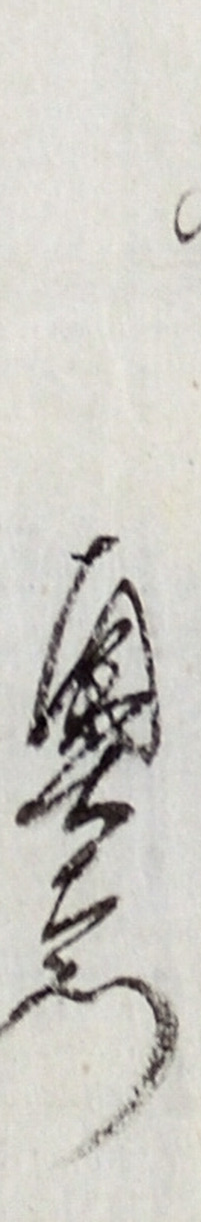茂右衛門
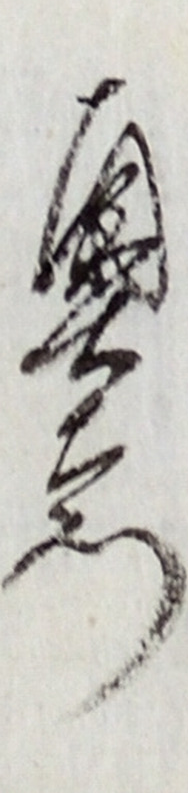茂右衛門
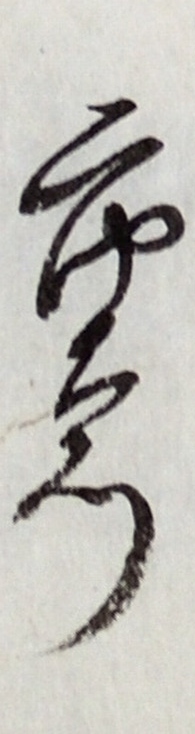茂右衛門
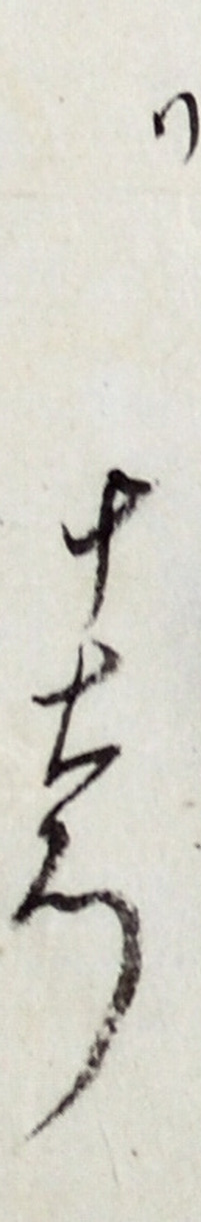同十右衛門
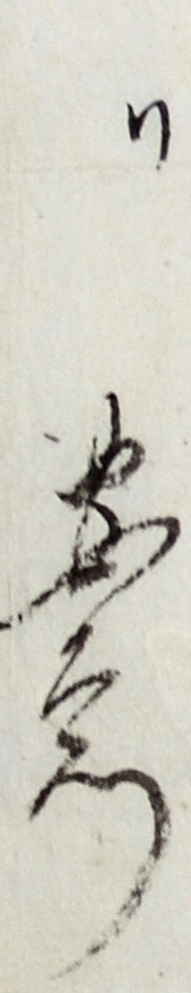同清右衛門
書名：御林御竹藪証文控
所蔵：伊那市立高遠町図書館・合同会社AMANE
